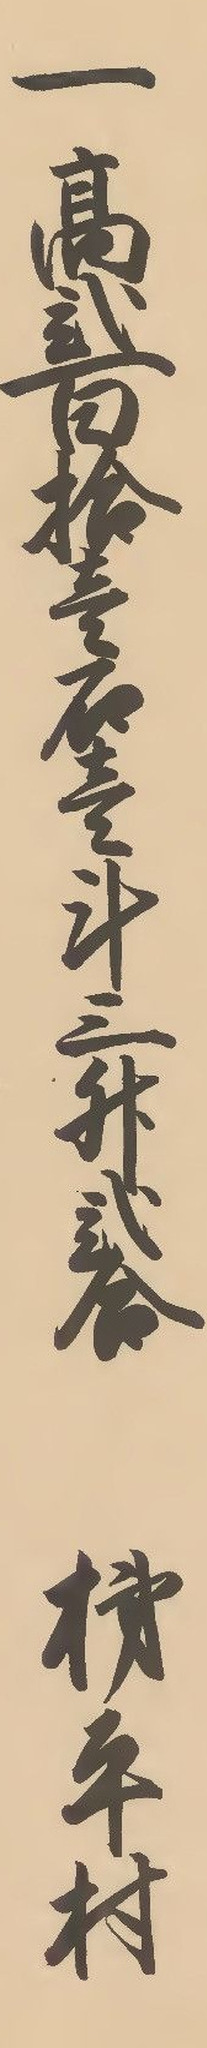一高弐百拾壱石壱斗三升弐合柿平村
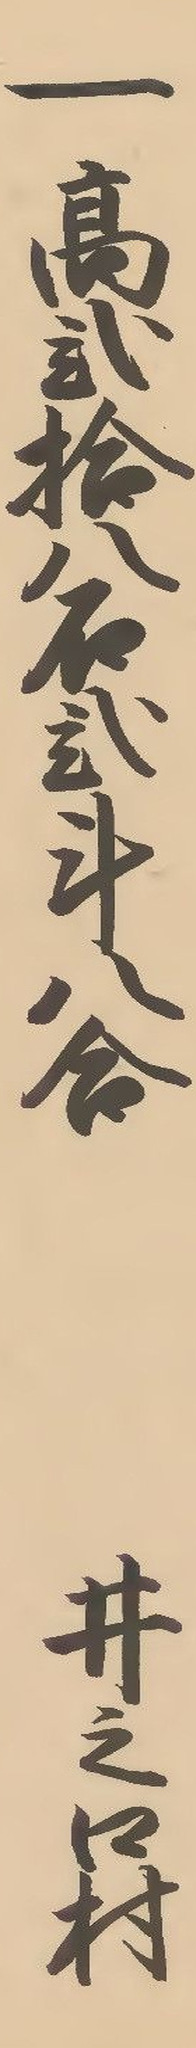一高弐拾八石弐斗八合井之口村
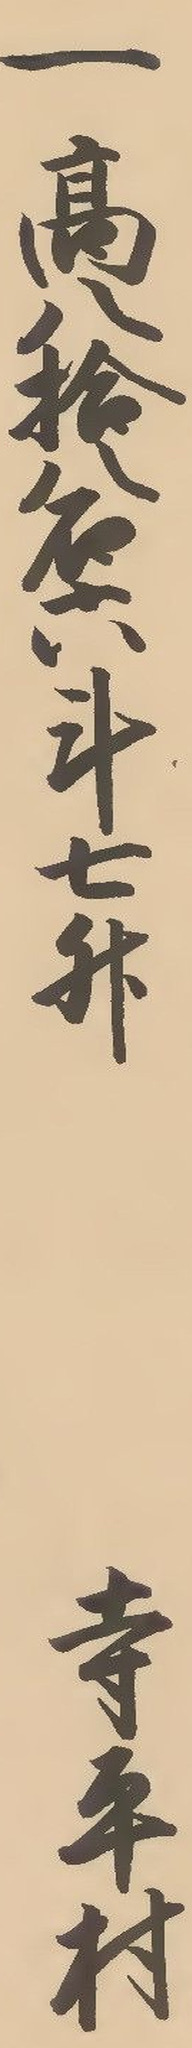一高八拾八石六斗七升寺平村
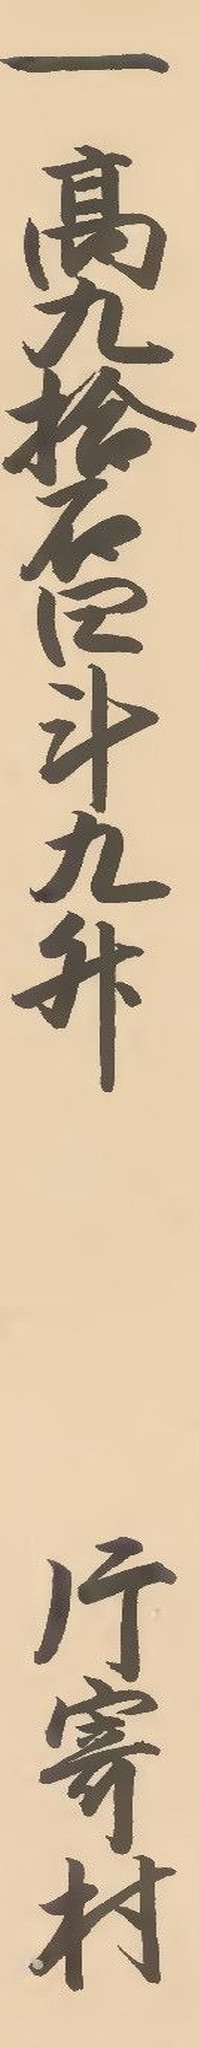一高九拾石四斗九升片寄村
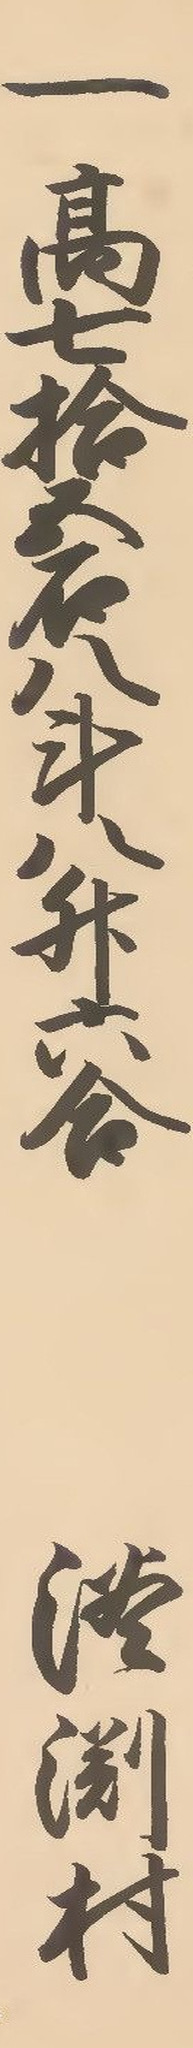一高七拾五石八斗八升六合淡淵村
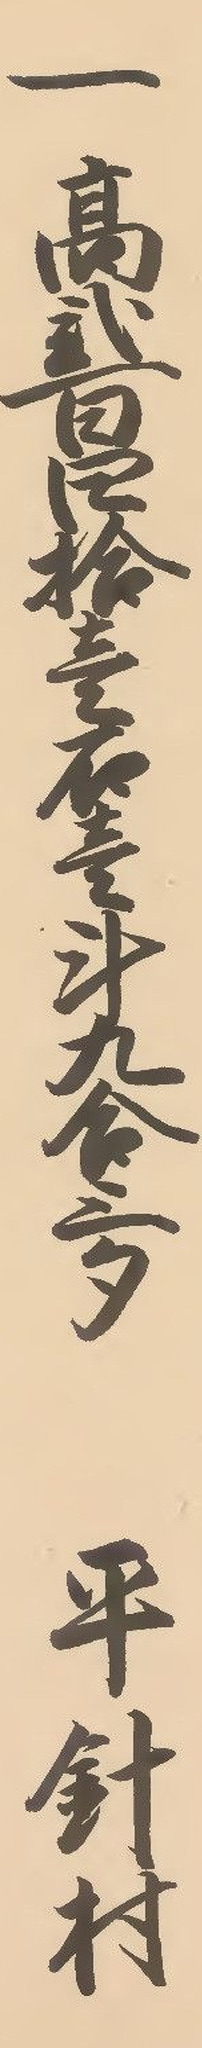一高弐百四拾壱石壱斗九合三勺平針村
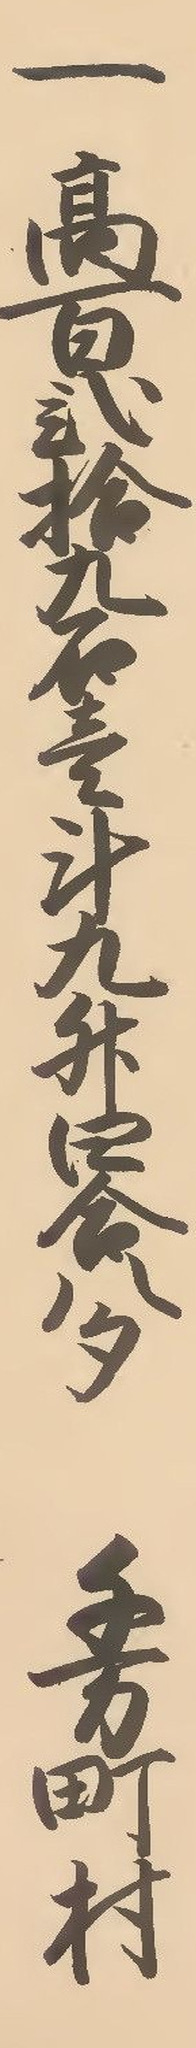一高百弐拾九石壱斗九升四合八勺千万町村

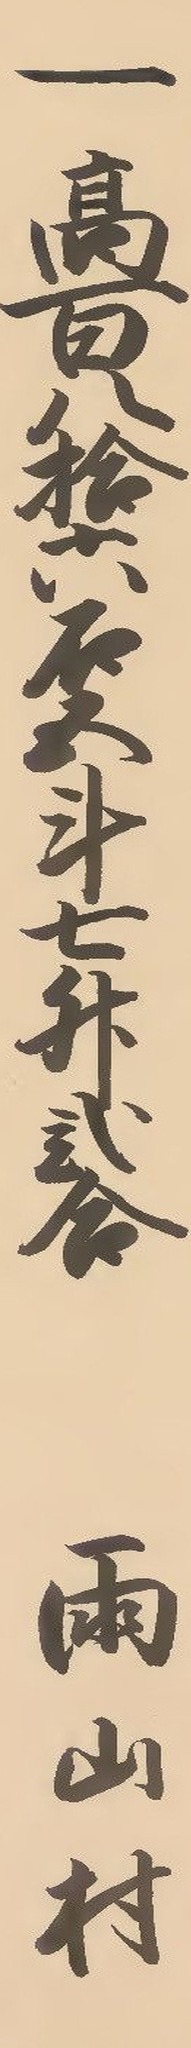一高百八拾六石五斗七升弐合雨山村
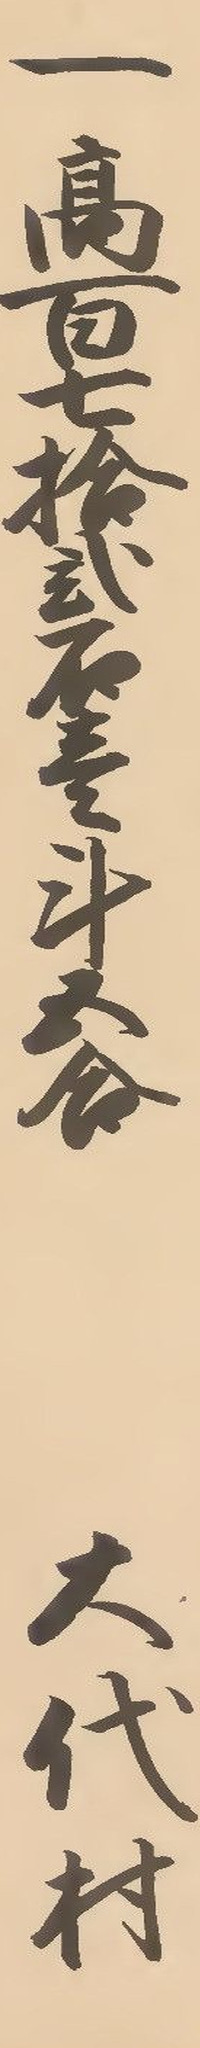一高百七拾弐石壱斗五合大代村

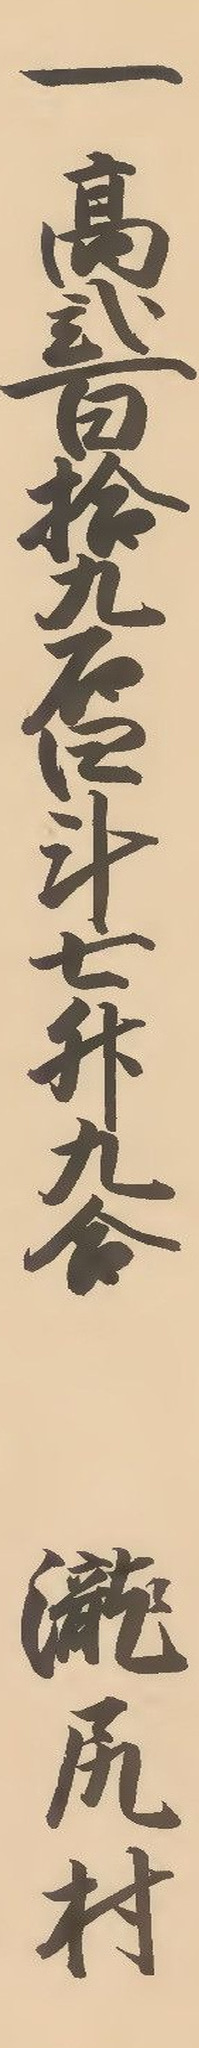一高弐百拾九石四斗七升九合滝尻村
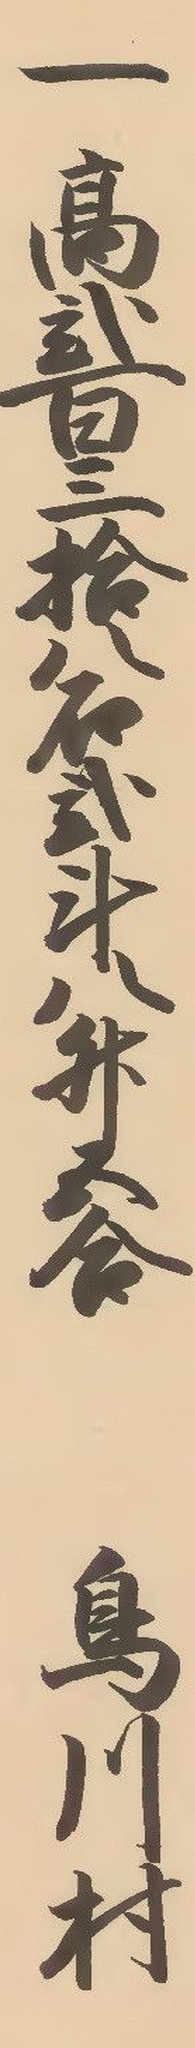一高弐百三拾八石弐斗八升五合鳥川村
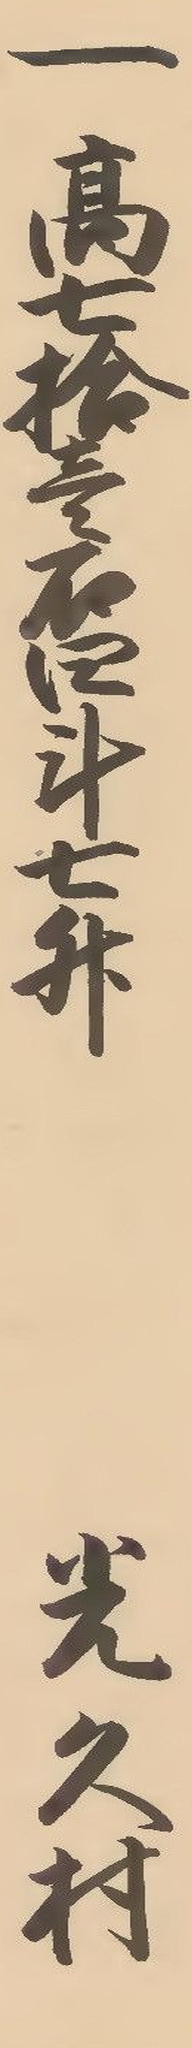一高七拾壱石四斗七升光久村
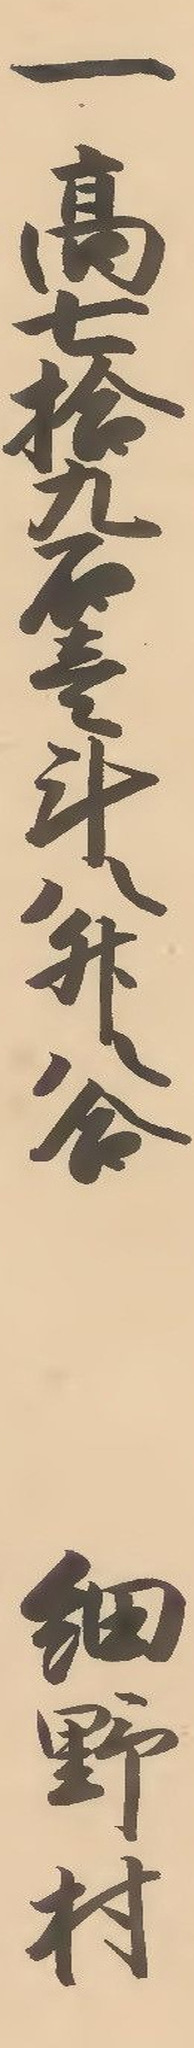一高七拾九石壱斗八升八合細野村
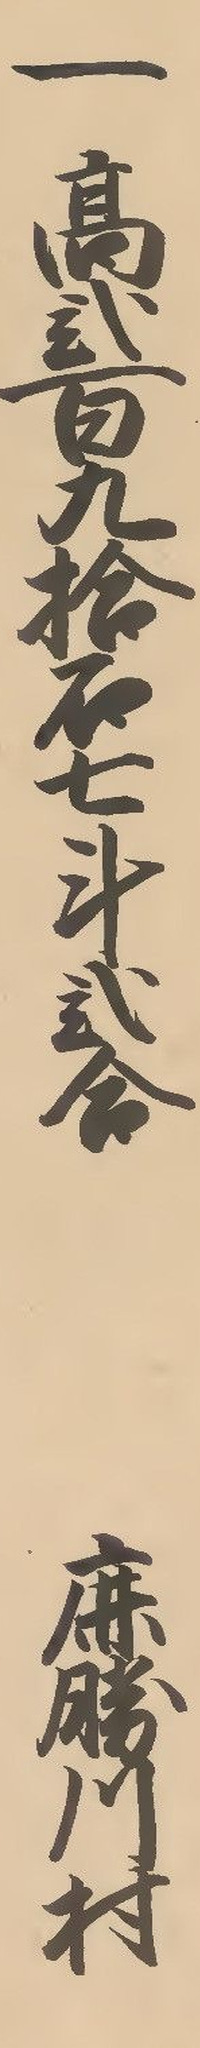一高弐百九拾石七斗弐合鹿勝川村
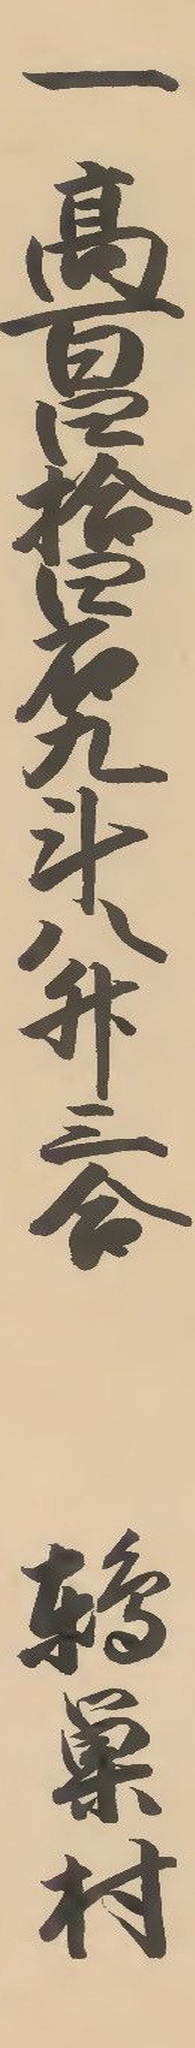一高百四拾四石九斗八升三合鶫巣村
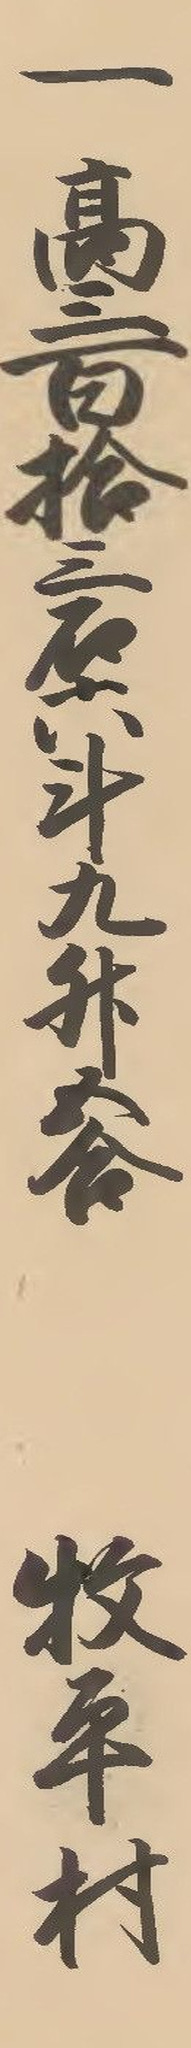一高三百拾三石六斗九升五合牧平村
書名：三河国郷帳
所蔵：国立公文書館 National Archives of Japan
